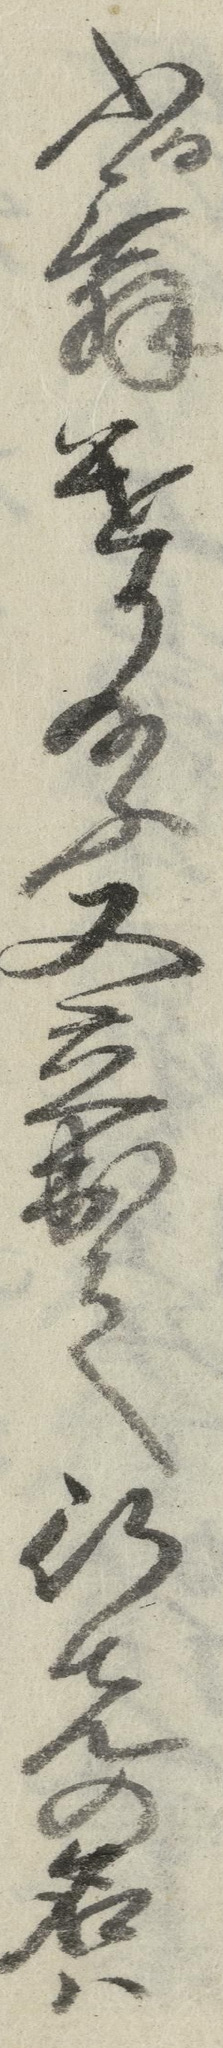ふる舞遣り給ふ又立出て行先の名は
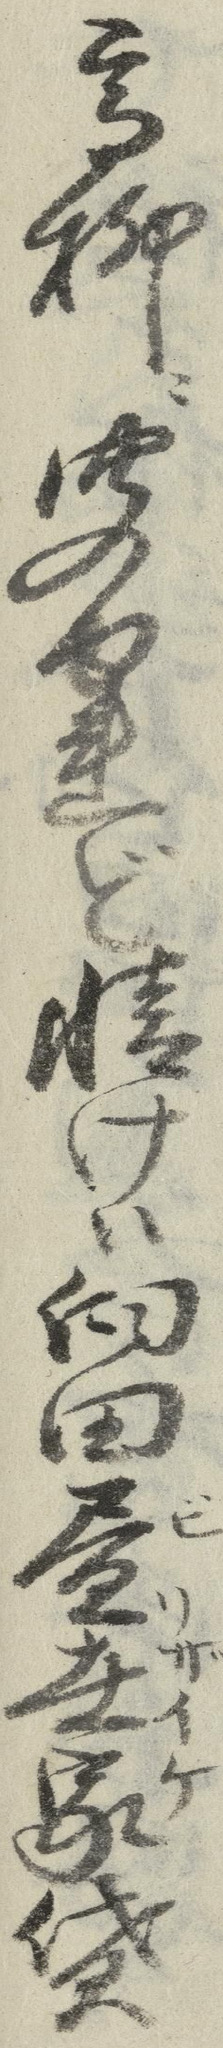高柳に聞ゆれど情けハ向田昼在家貸
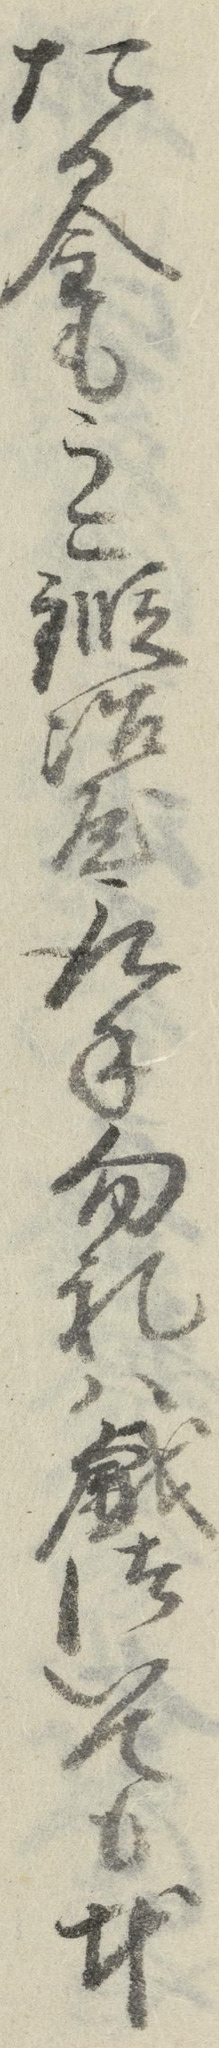たる金もらと鍛冶屋取手勿れは戯ついても本
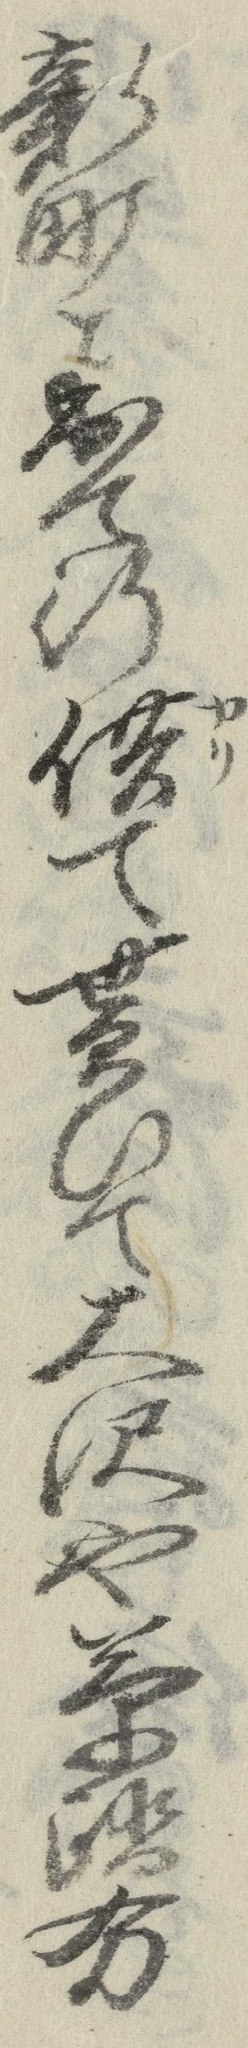新町と出て行借て貰ひて大沢や草踏分
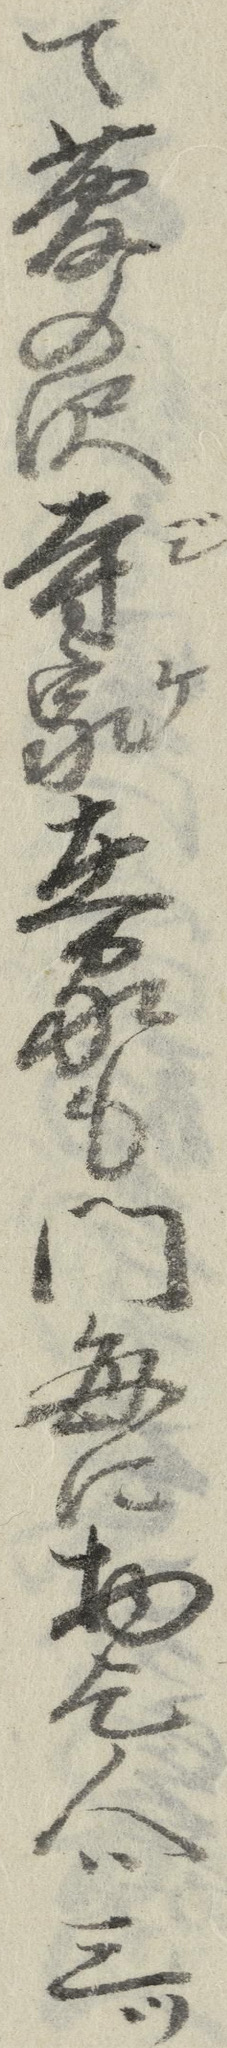て菅の沢寺家在家も門毎に物乞人は三ツ
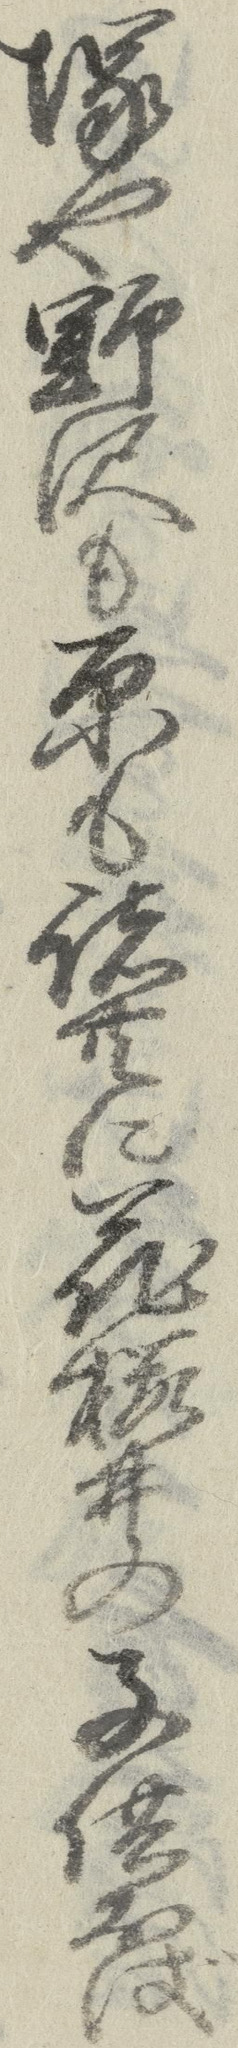塚や野沢も原も諸共に花桜井の子供おば
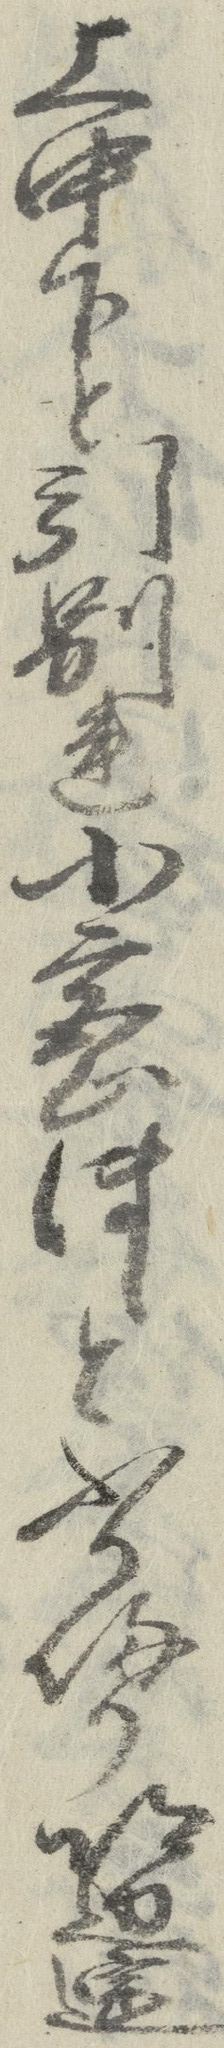上中下と引別れ小宮山ほしとふり帰り跡辺遥
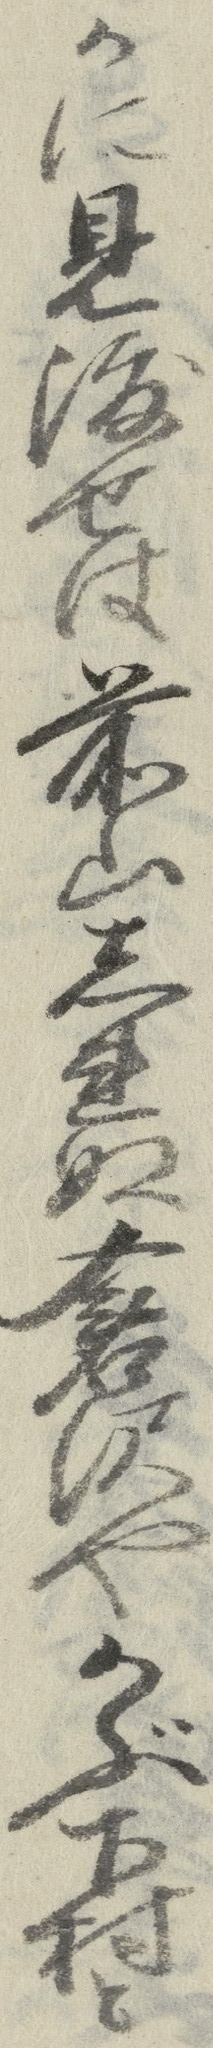かに見渡せは前山しれぬ倉沢やかぶ下村と
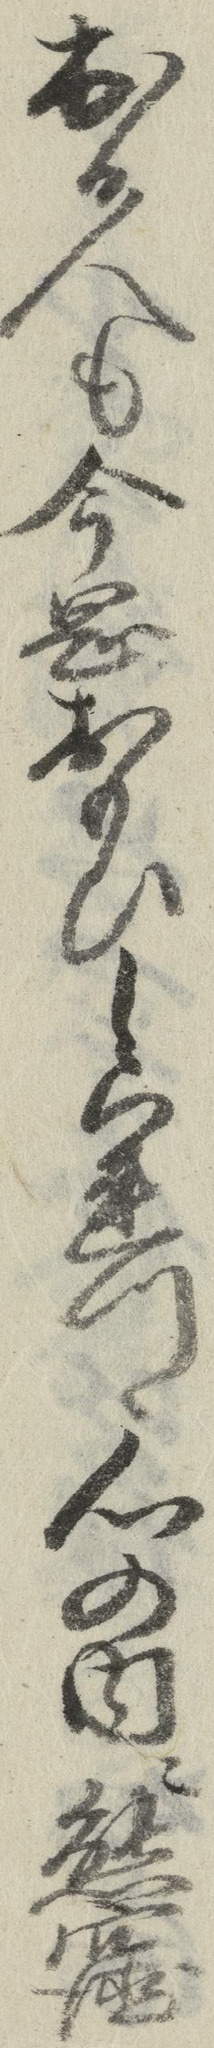出る人も今岡おもひしられつゝ心の内に態窟
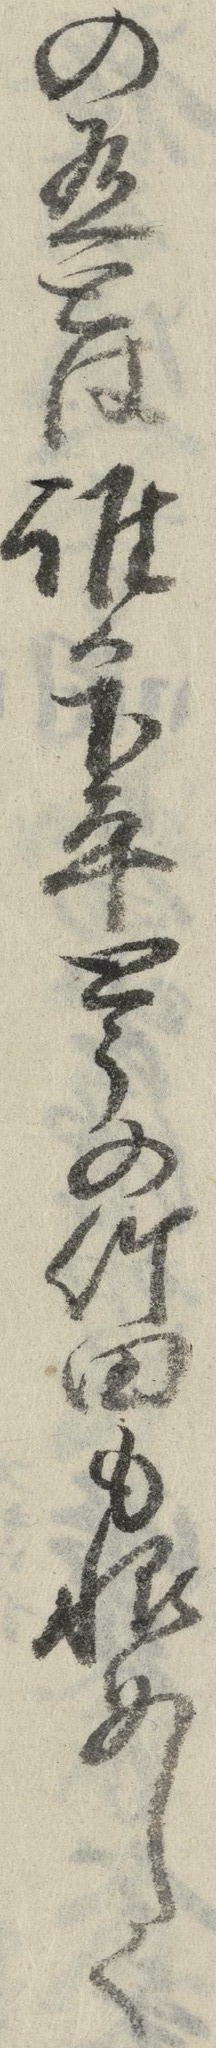の有とは誰か下平とうの竹田も恨めしく

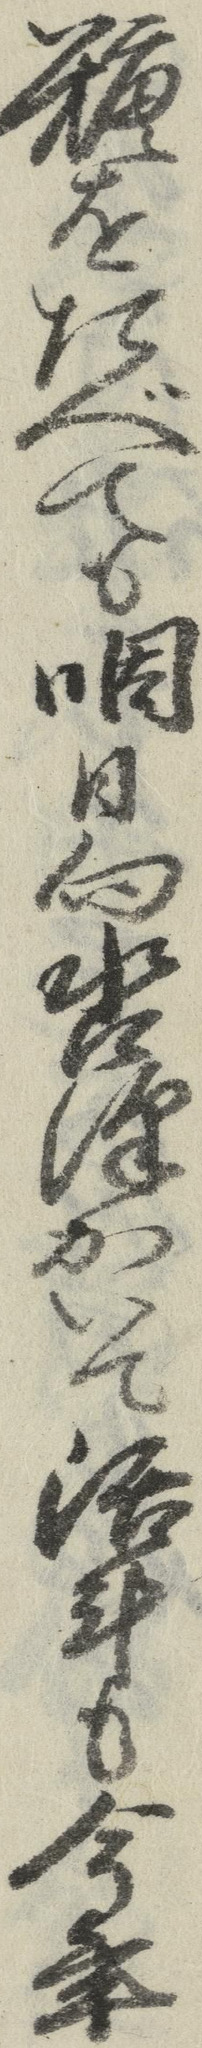糖をたべても咽日向沓沢かいて活計も今年
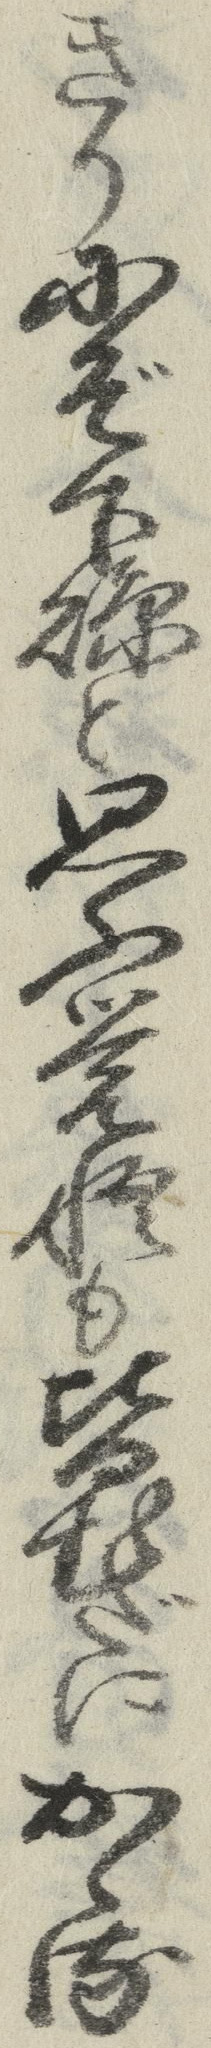きりにぞ下練と思ふ覚悟も皆むだにかゝる
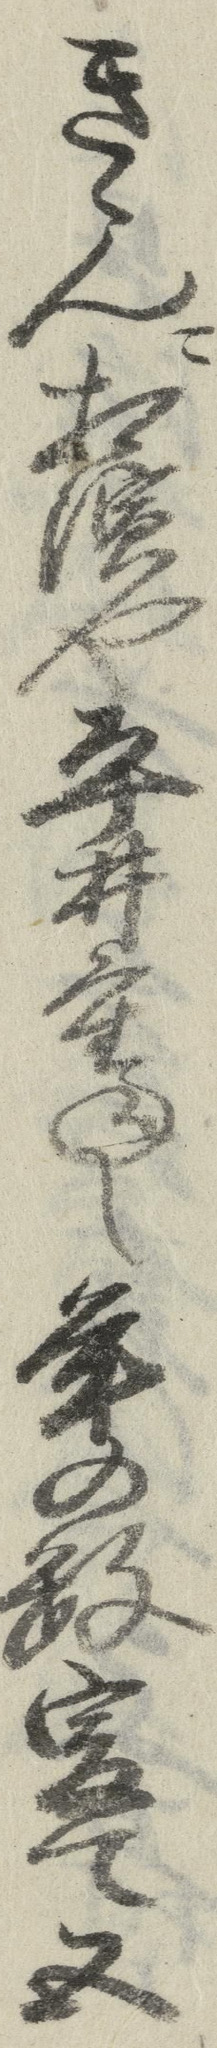きゝんに相浜や平井重ねし年の数爰て五
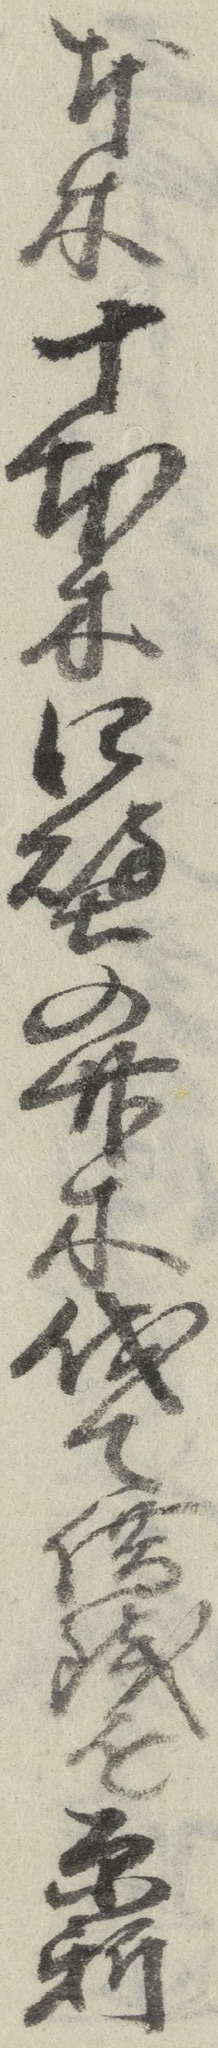本木十本木四壁の竹木伐て借銭を原斬
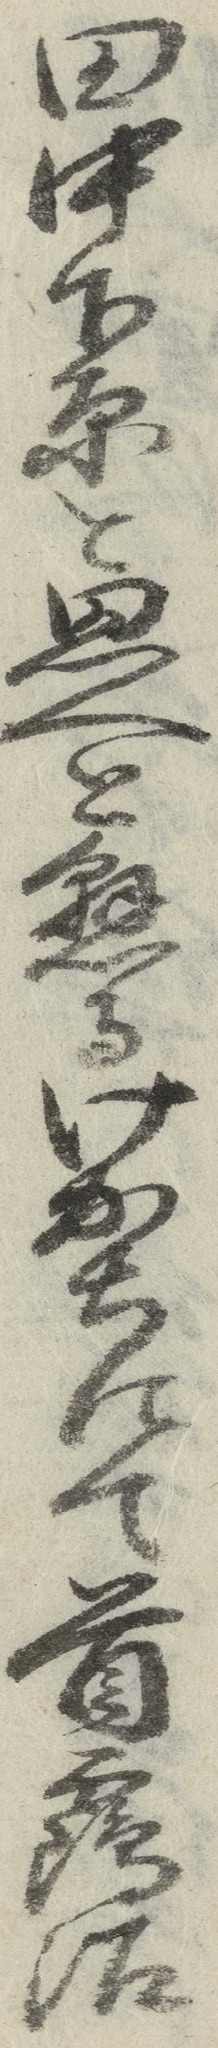田中下原と思へと懸るけかちにて首鶴沽
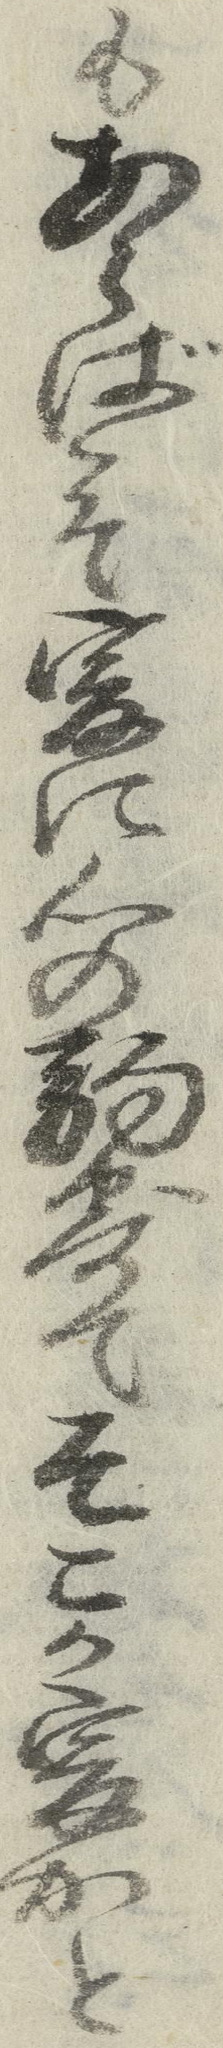もあらばこそ爰に心の駒寄てそこか爰かと
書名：浅間大焼騒動記　中
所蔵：東京大学地震研究所図書室 Earthquake Research Institute Library, The University of Tokyo, JAPAN
